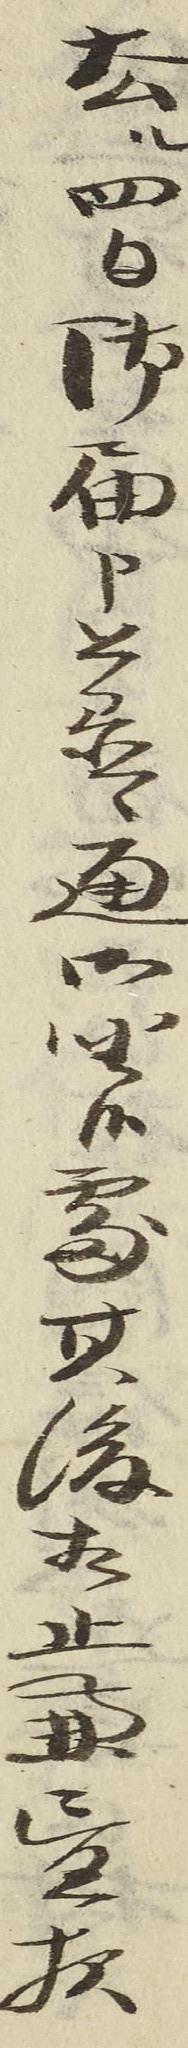去ㇽ四日御届申上置候通二御坐候処其後相止兼昼夜
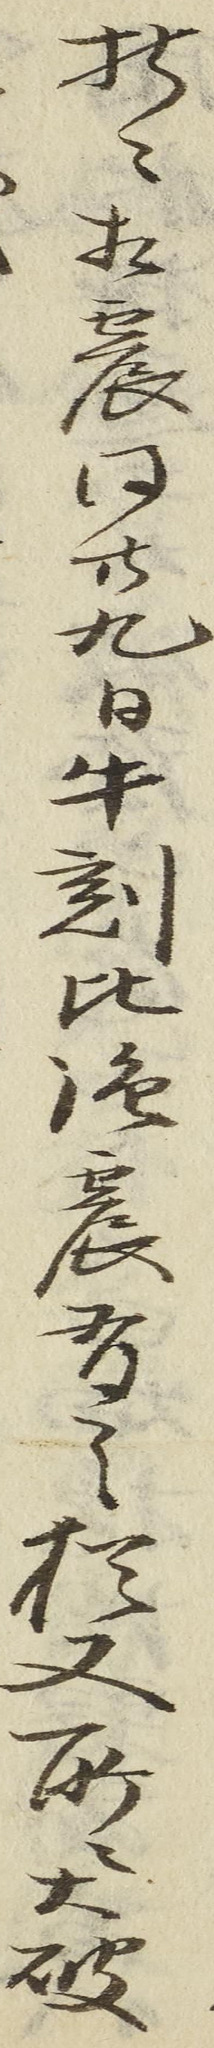折々相震同廿九日午刻比強震有之猶又所々大破
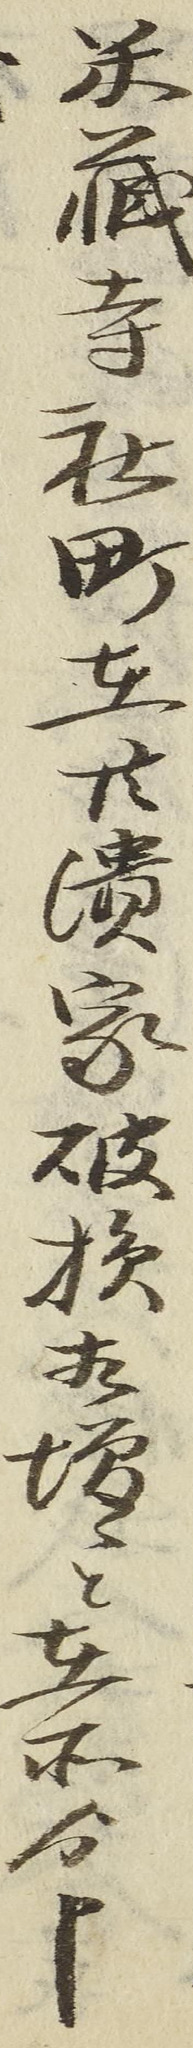米蔵寺社町在共潰家破損相増候と在所ゟ申
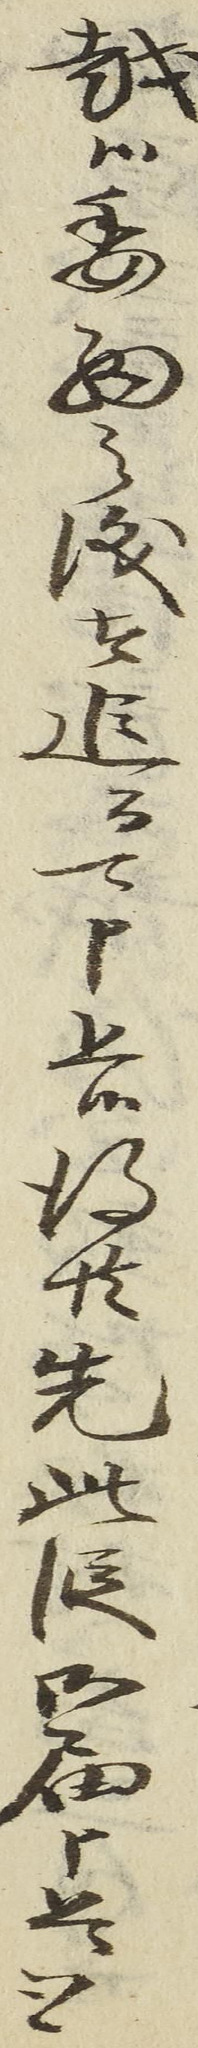越候委細之儀は追而可申上候得共先此段御届申上候以上
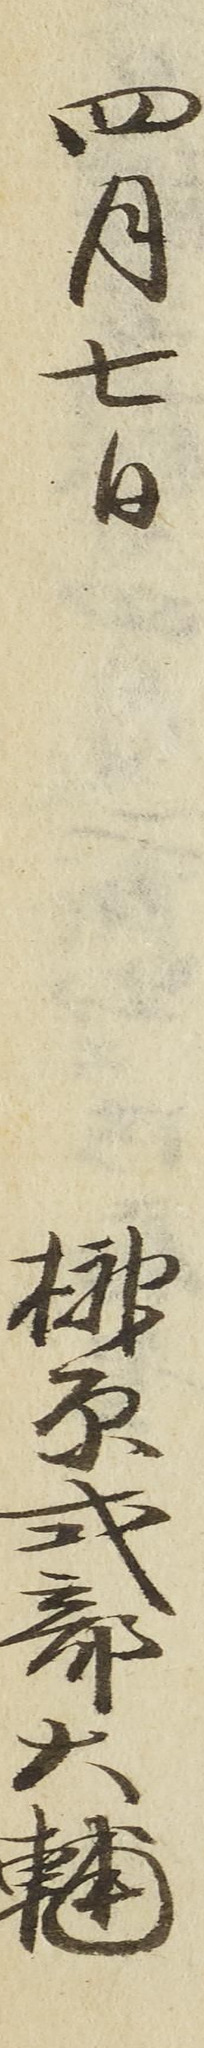四月七日榊原式部大輔

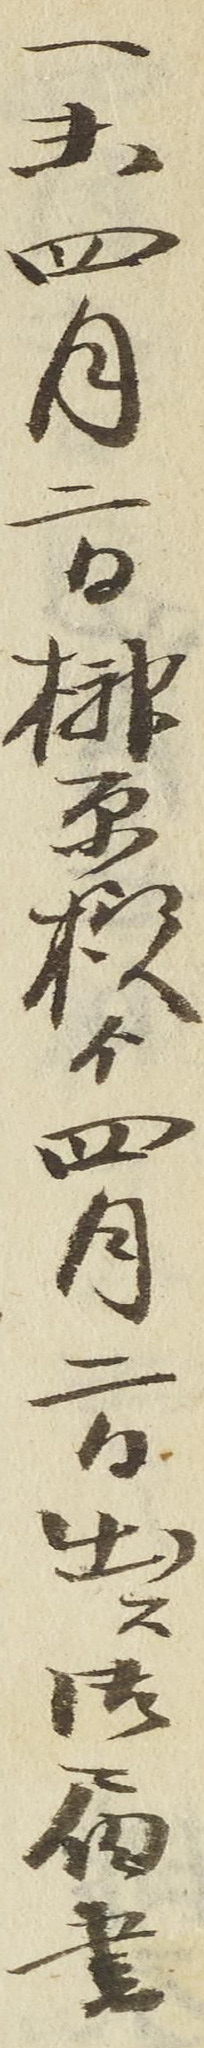一未四月二日榊原様四月二日出ㇲ御届書
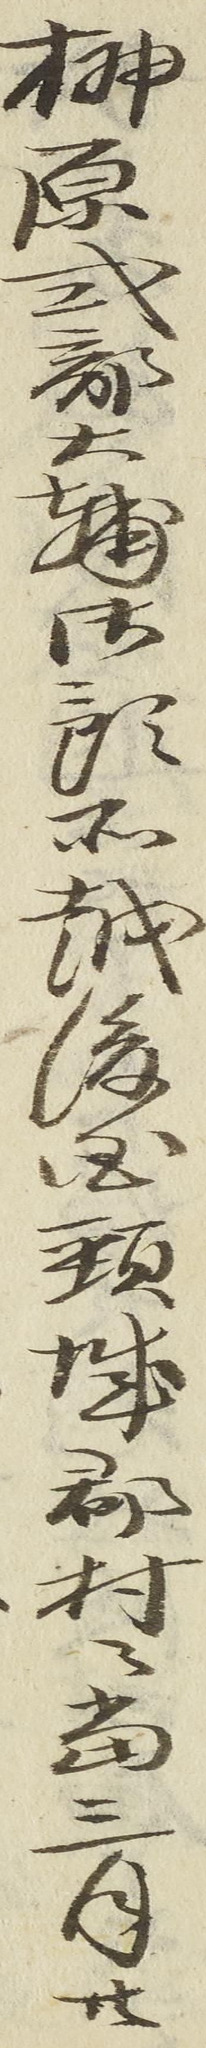榊原式部大輔御預所越後国頸城郡村々当三月廿
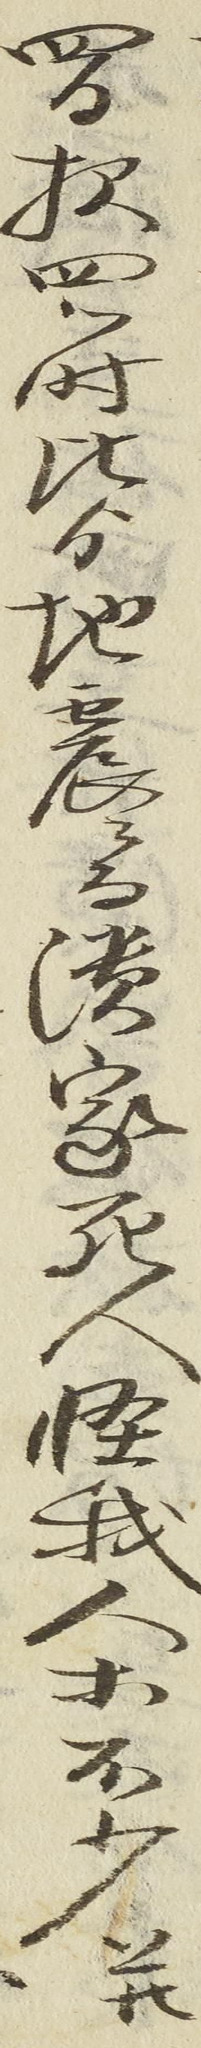日夜四ッ時比ゟ地震二而潰家死人怪我人等不少并
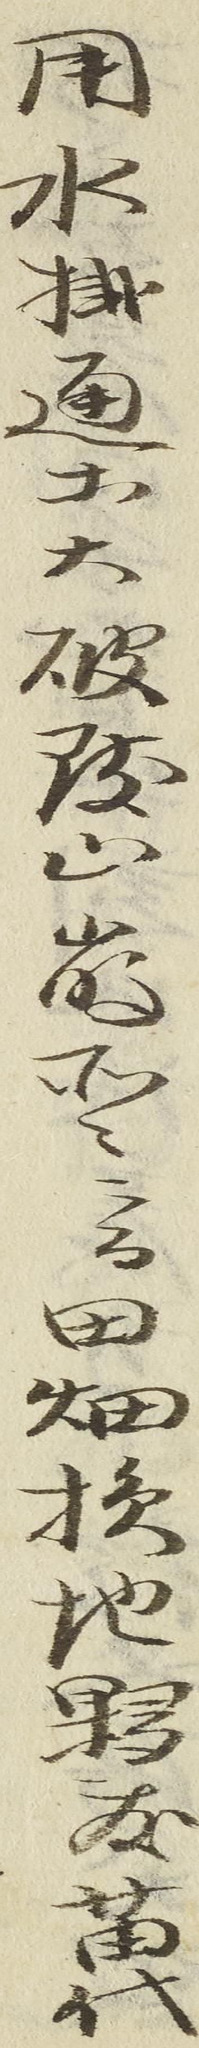用水掛等大破致山崩所々二而田畑損地夥敷苗代
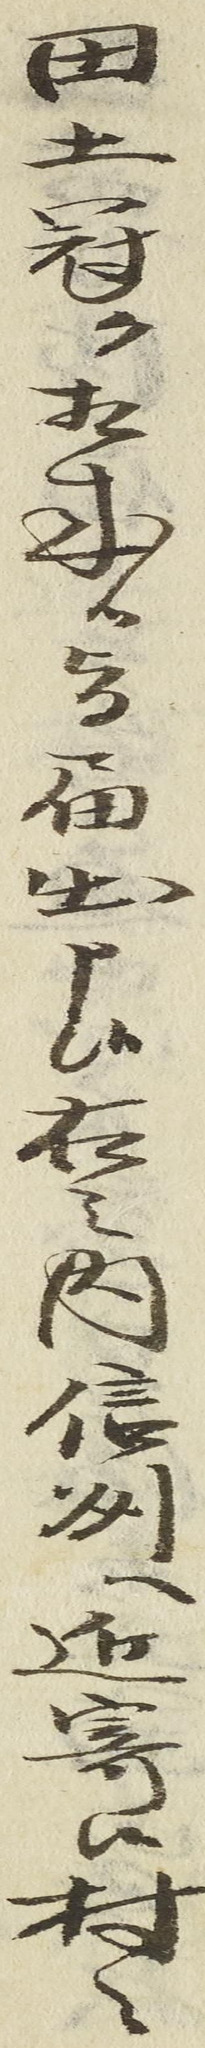田土冠ク相成候旨届出申候右之内信州へ近寄矦村々
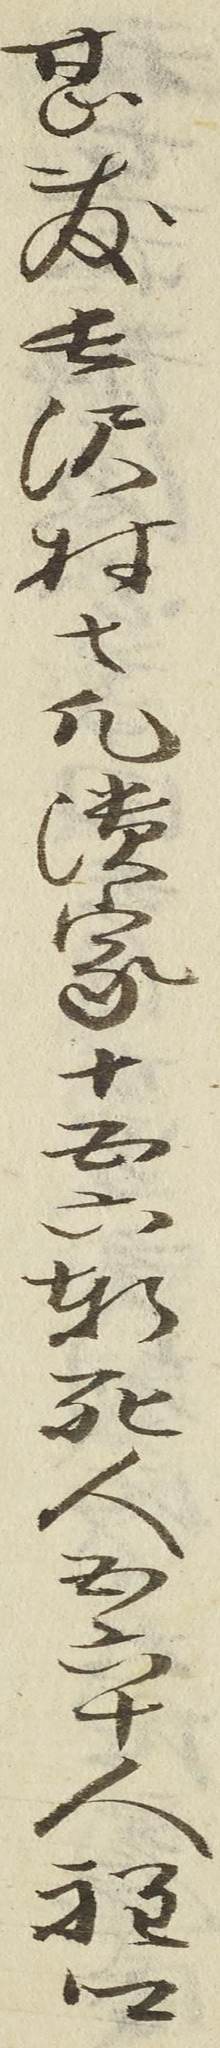甚敷長沢村は潰家十五六軒死人五六十人程郷
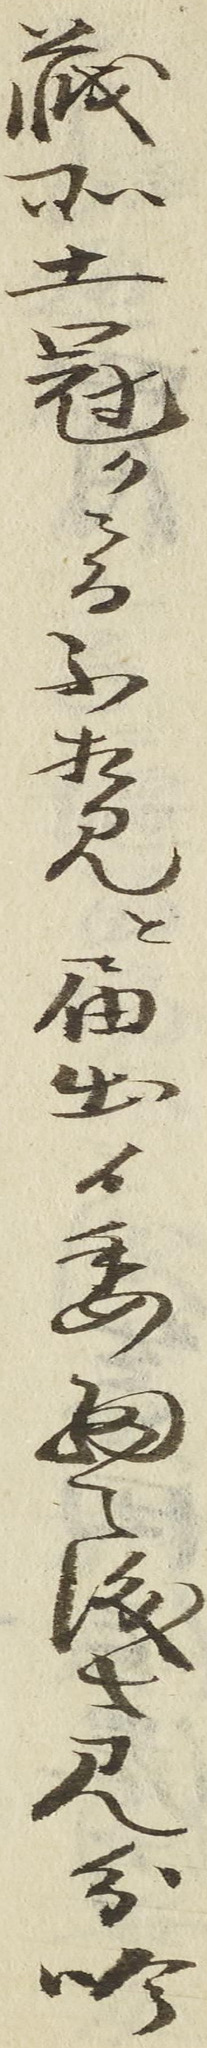蔵所土冠ク二而不相見と届出候委細之儀は見分吟
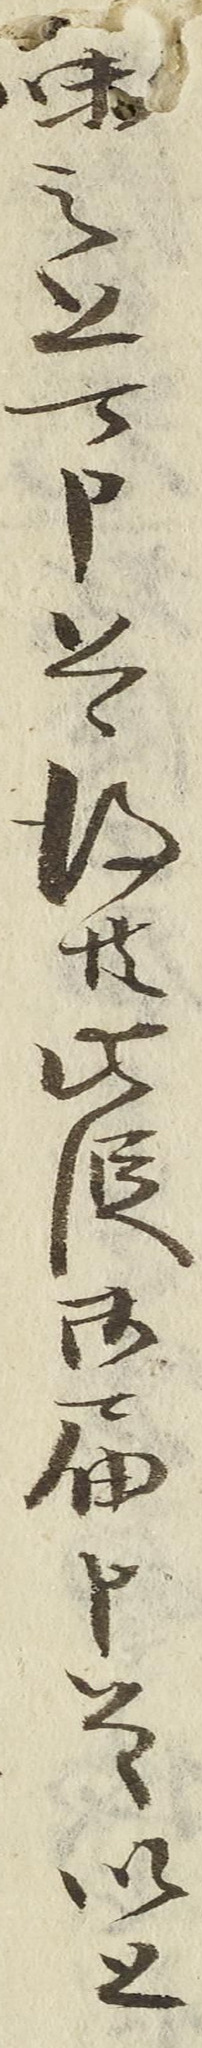味之上可申上候得共此段御届申上候以上
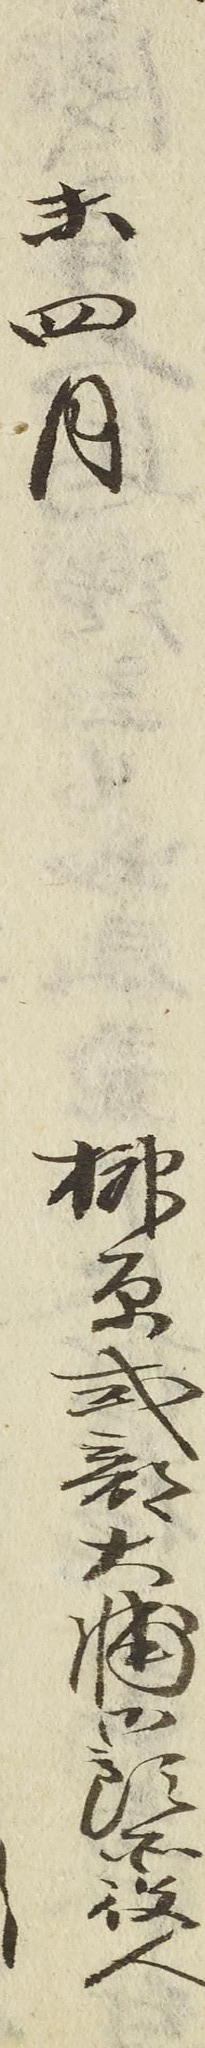未四月榊原式部大輔御預国役人
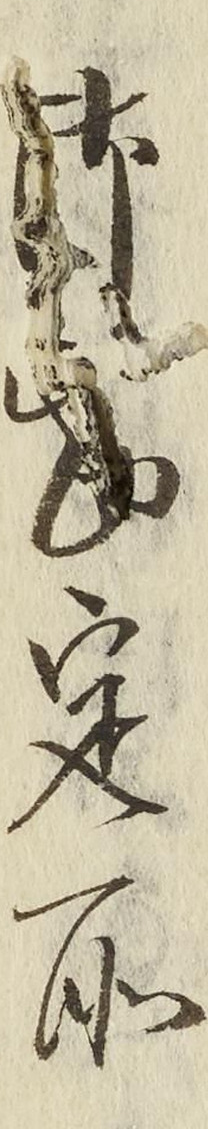御勘定所
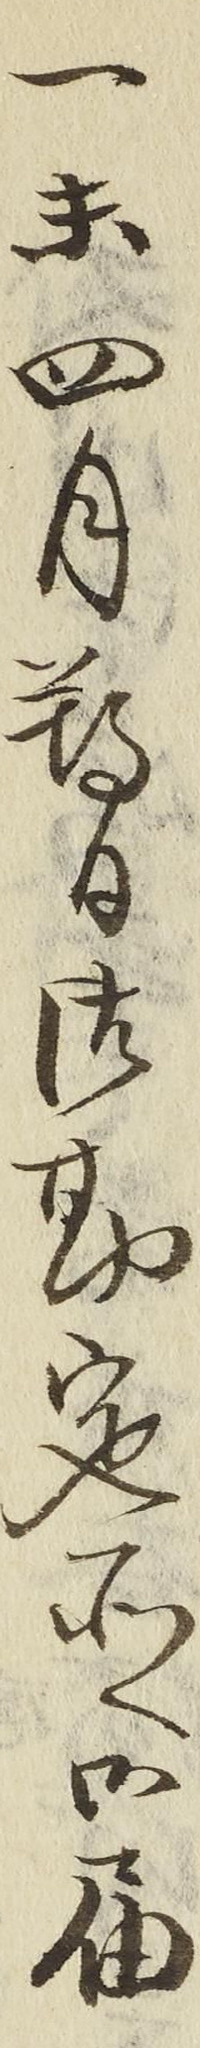一未四月朔日御勘定所へ御届
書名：信濃國大地震記　乾
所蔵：東京大学地震研究所図書室 Earthquake Research Institute Library, The University of Tokyo, JAPAN
